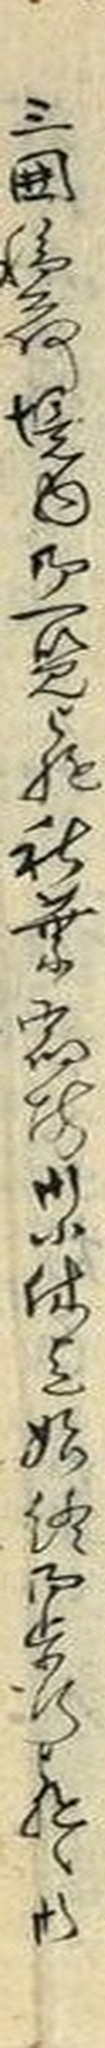三囲稲荷境内御一覧被遊秋葉宿坊御小休迄始終御歩行被遊候御
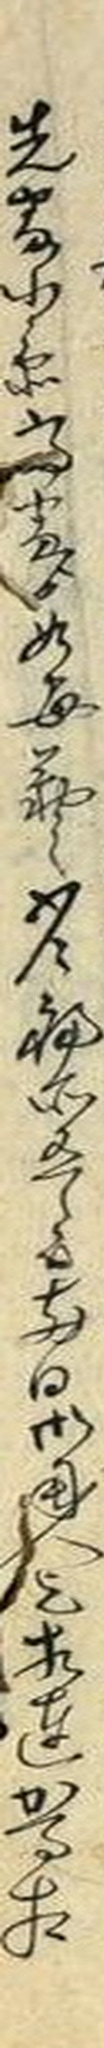先番小兵衛当番ゟ如毎勤之少々痛所有之ニ付両日御用人迄相達駕相
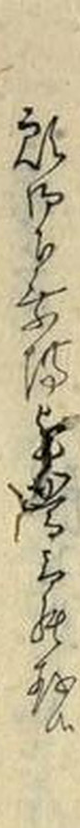願御下乗場迄駕ニ而罷越候

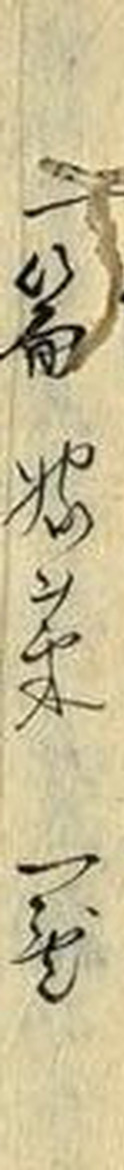筍嫁菜一台
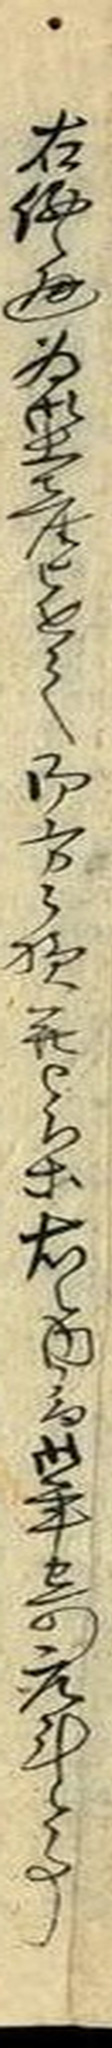右例之通為御土産被進之御方々様并被下等右之内ニ而御年寄取斗候事
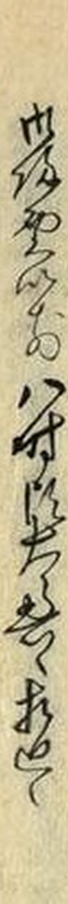御帰殿以前八時頃大奥へ相廻候
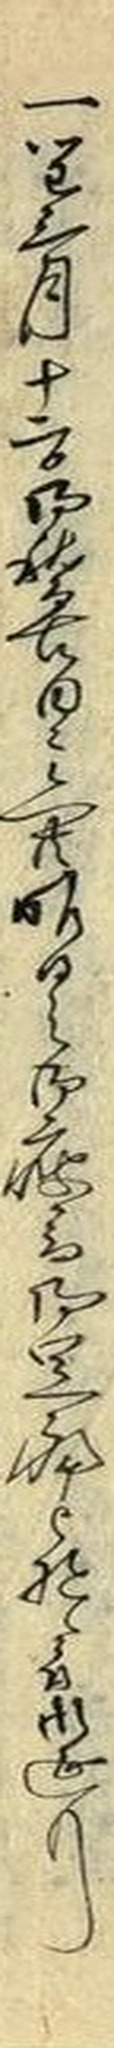一閏三月十二日御稽古日ニ候へ共昨日之御疲ニ而御足痛被遊候ニ付御延引
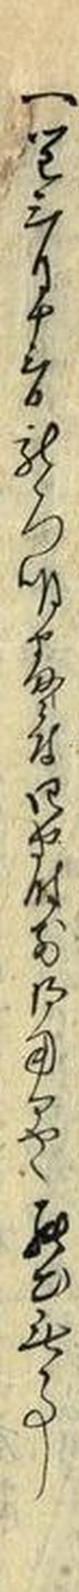一閏三月十三日新右衛門明番ニ付四半時前御用部やへ罷出無候事
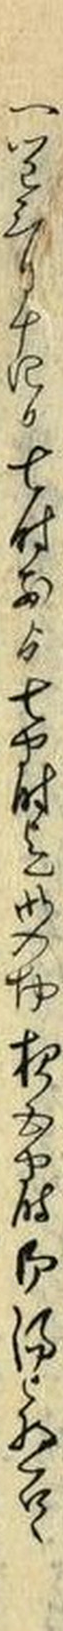一閏三月十四日七時前ゟ七半時迄御〆切夜五半時御湯被召候
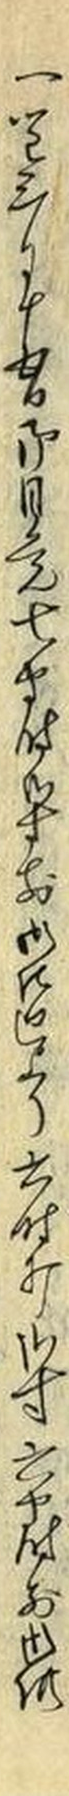一閏三月十五日御目覚七半時弐寸前御仕廻上り六時打弐寸六半時前御供
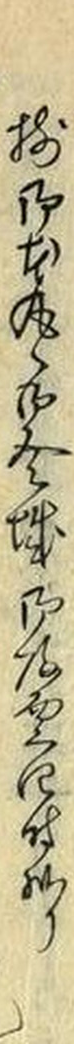揃御本丸へ御登城御帰殿四時掛り
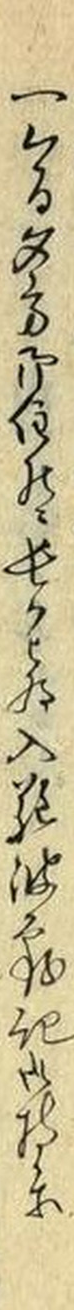一今日夕方御住居ニ長ク被為入難波戦記御持参
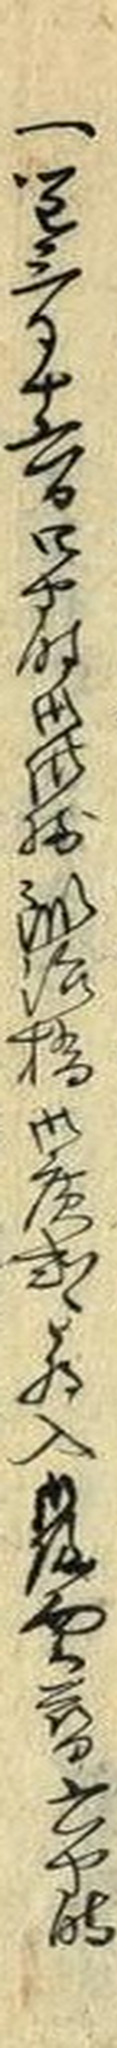一閏三月十六日四半時御供揃鍛冶橋御広式へ被為入御帰殿六半時
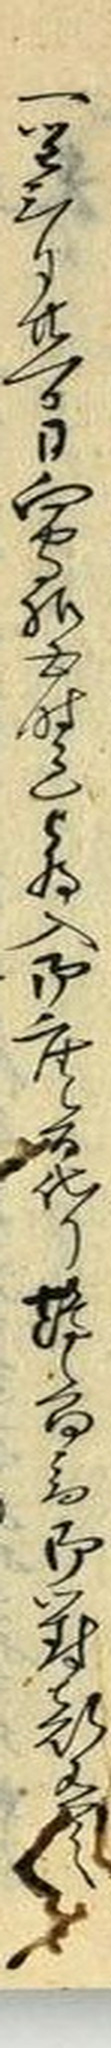一閏三月廿一日日向守様五時迄被為入御座之間代り鶴之間ニ而御対顔有之
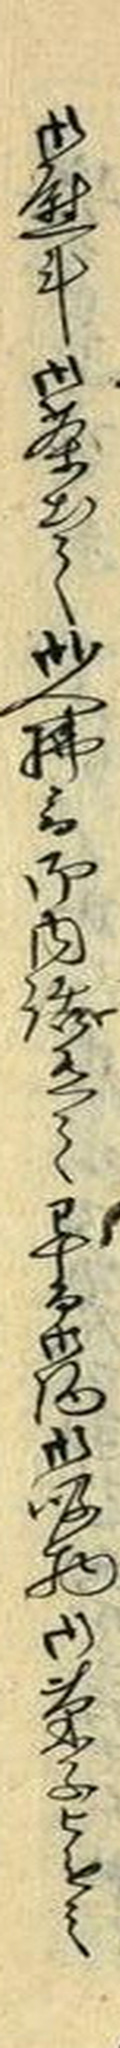御熨斗御茶出之御人払ニ而御内話有之畢而御酒御吸物御菓子被進之
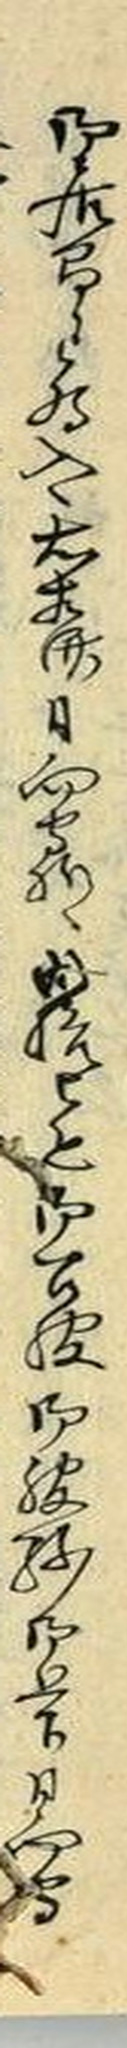御居間へ被為入候右相済日向守様へ御膳被進御召服御服紗御上下日向守
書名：少傅日録抄（斉承付側向頭取日記、在府）
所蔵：福井県文書館 Fukui Prefectural Archives
